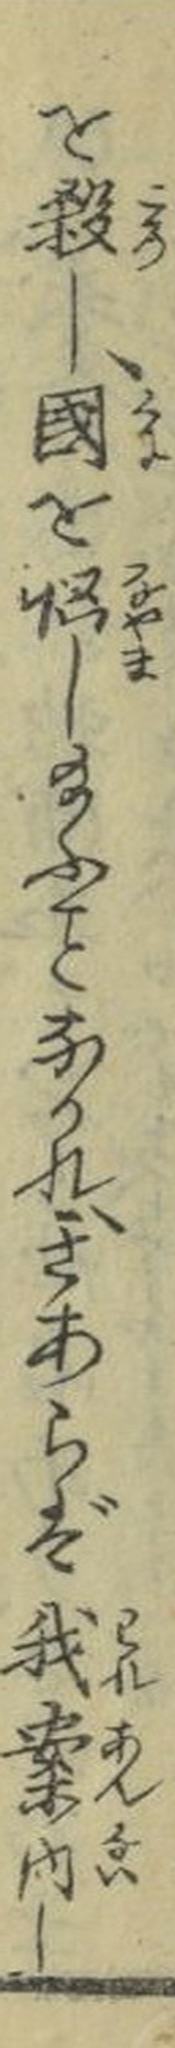を殺し、国を悩し給ふことなかれ、さあらば我案内し
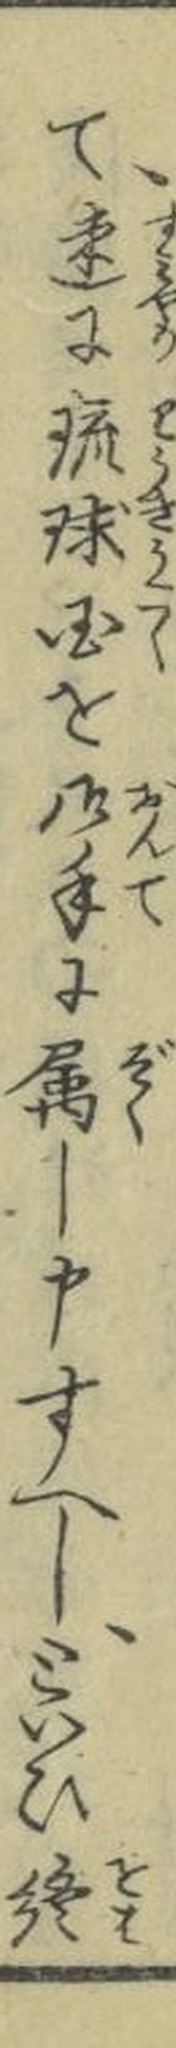て、速に琉球国を御手に属し申すへし、といひ終
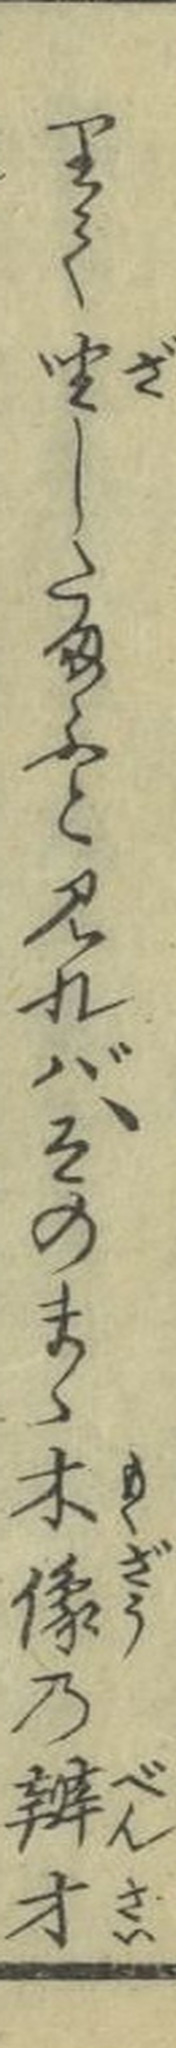りて坐したまふと見れば、そのまゝ木像の弁才
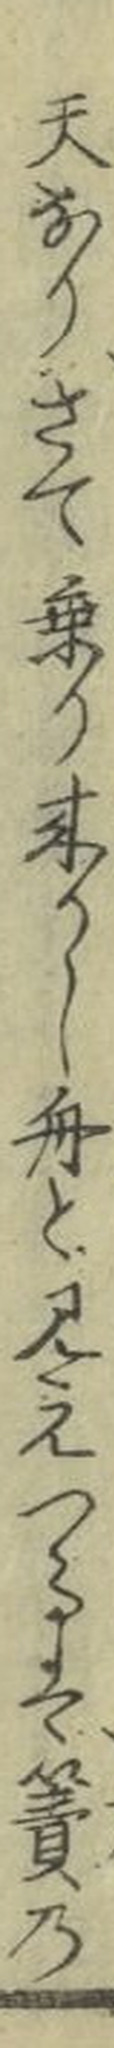天なり、さて乗り来りし舟と見えつるは、簀の
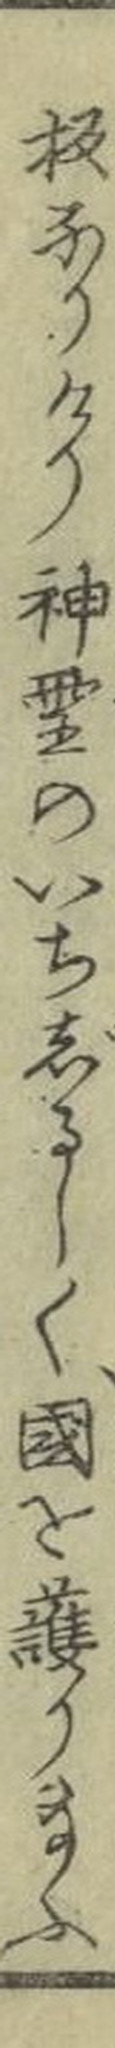板なりけり、神霊のいちじるしく、国を護り給ふ
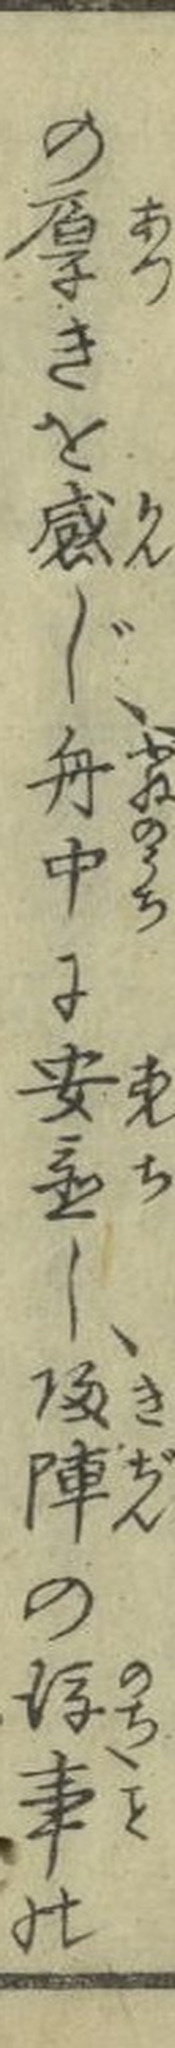の厚きを感じ、舟中に安置し、帰陣の後、事の
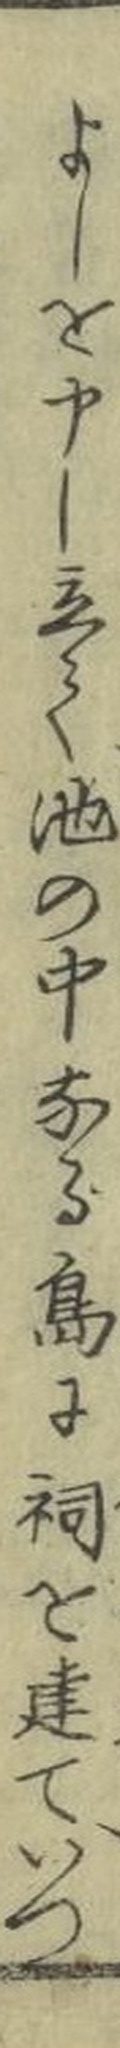よしを申し立て、池の中なる島に祠を建て、いつ

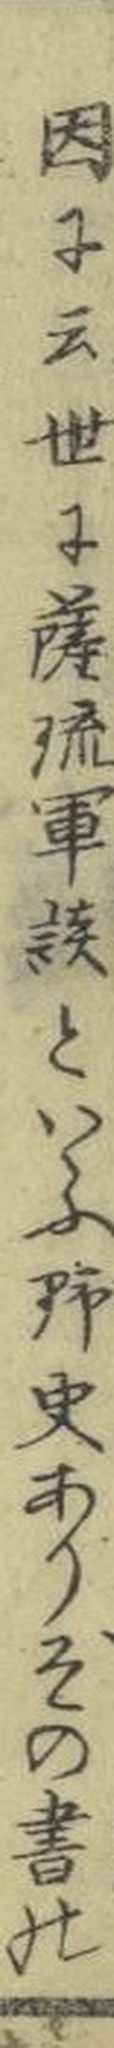因に云、世に薩琉軍談といふ野史あり、その書の
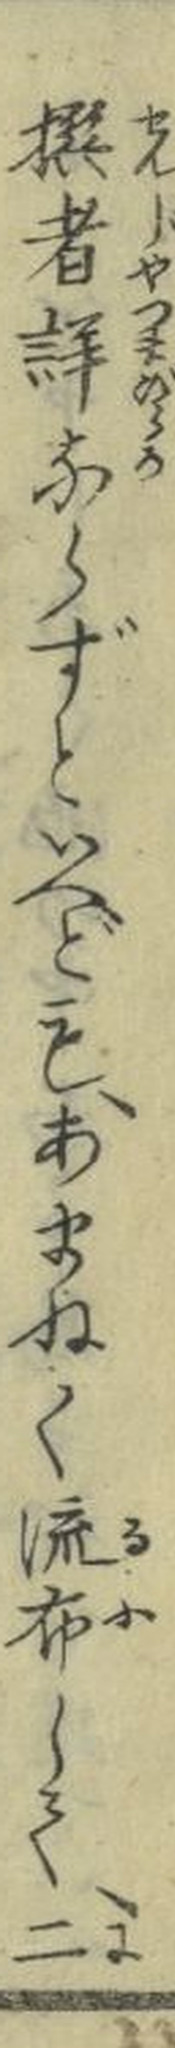撰者詳ならずといへども、あまねく流布して、二
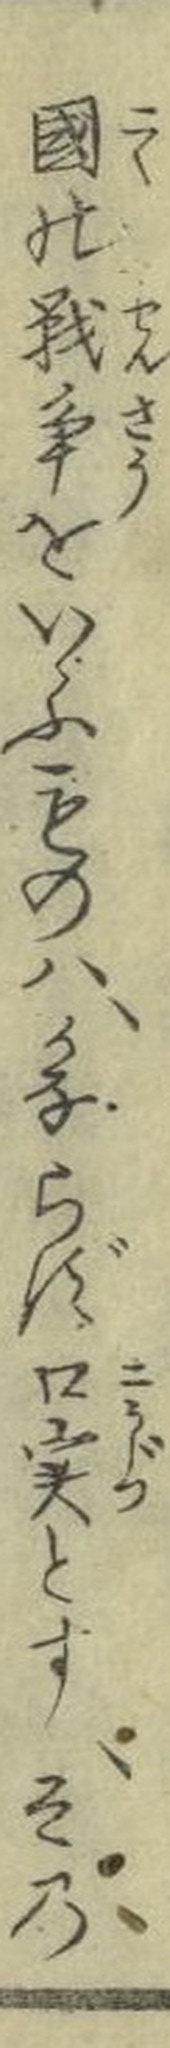国の戦争をいふものは、かならず口実とす、その
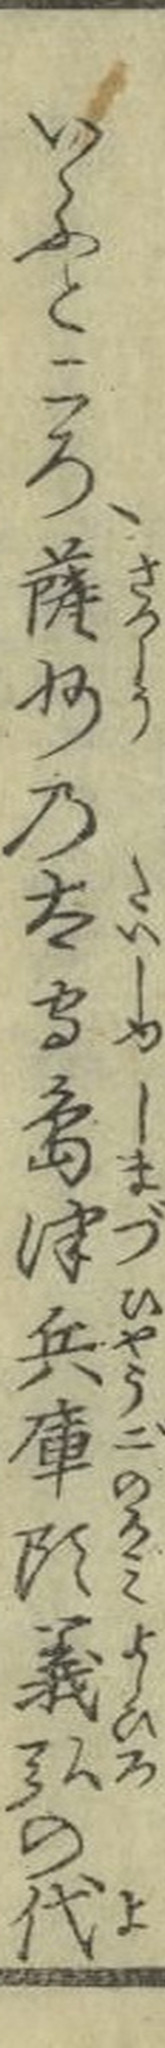いふところ、薩州の太守島津兵庫頭義弘の代
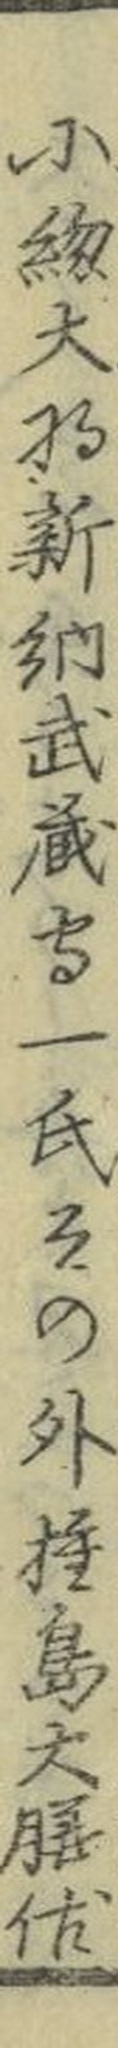に、惣大将新納武蔵守一氏、その外種島大膳、佐
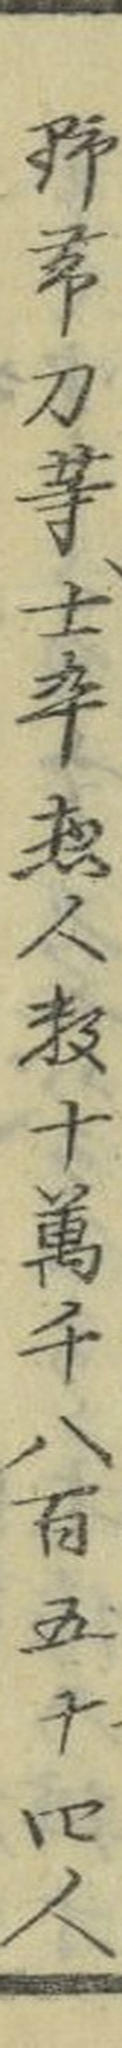野帯刀等、士卒惣人数十万千八百五十四人
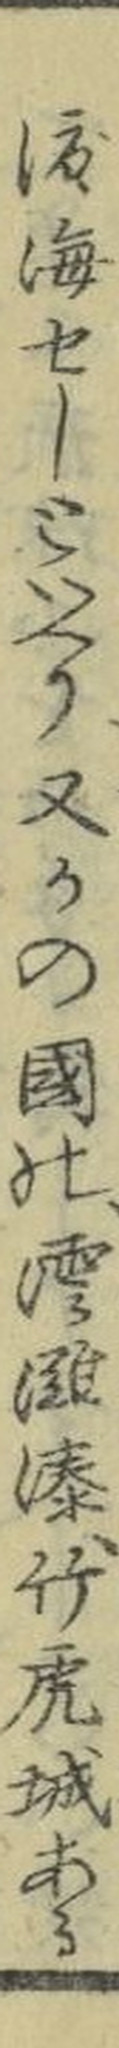渡海せしといへり、又かの国の、澐灘湊、竹虎城ある
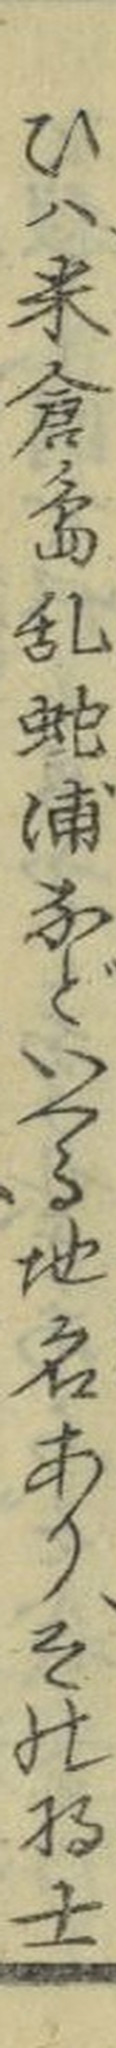ひは、米倉島、乱蛇浦などいへる地名あり、その将士
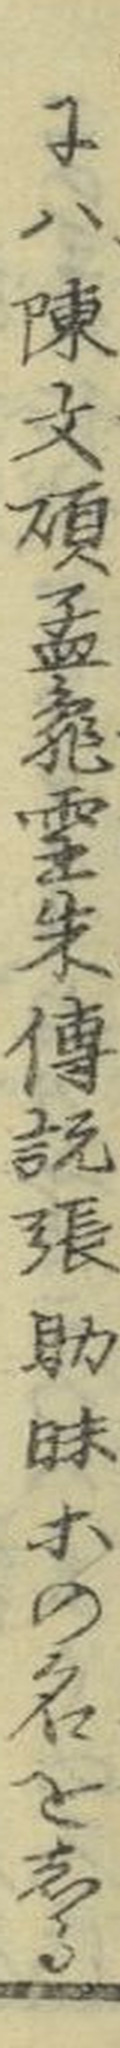には、陳文碩、孟亀霊、朱伝説、張助昧等の名をしる
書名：琉球入貢紀略
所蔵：University of the Ryukyus Library
